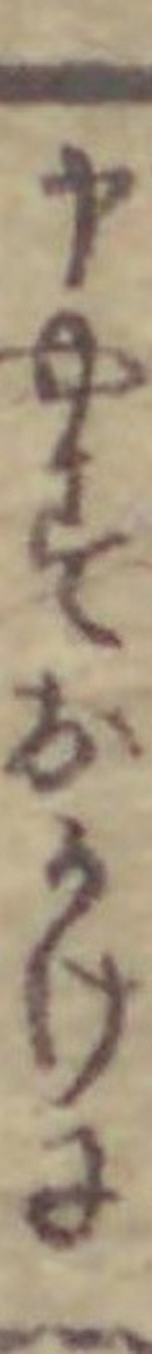申やすおかけに
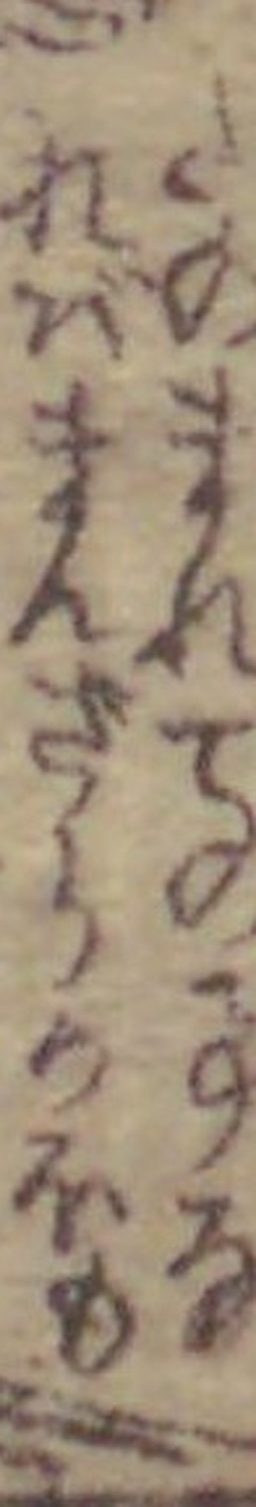ればまんざらかほも
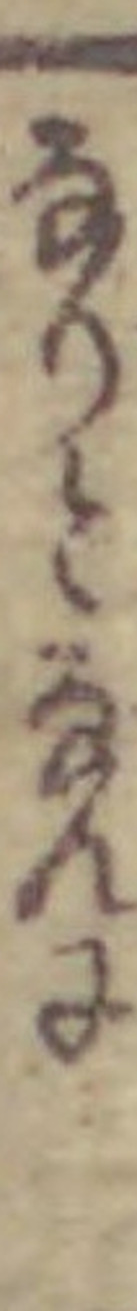なりとなんに
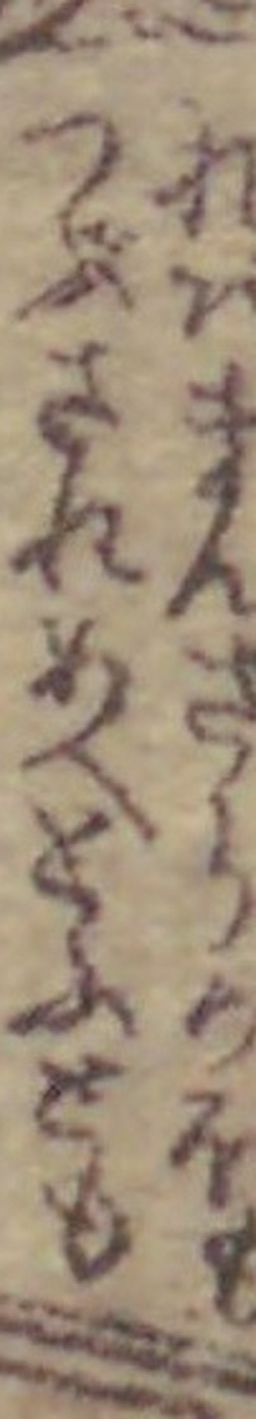つぶされめへとふとも
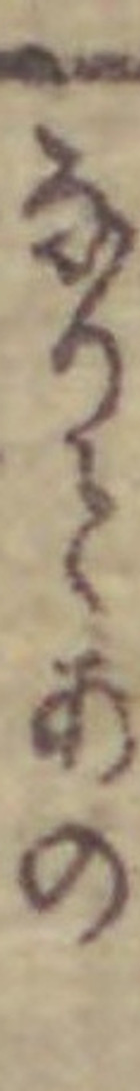なりとあの
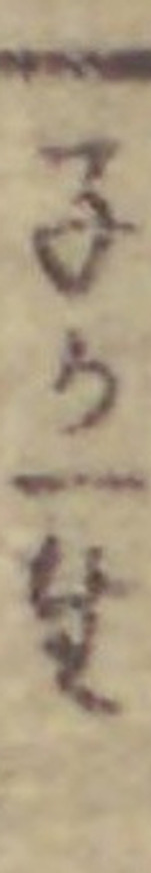子か一生
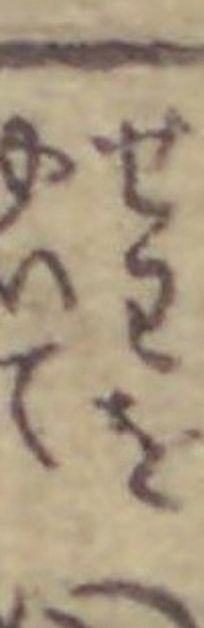やいて
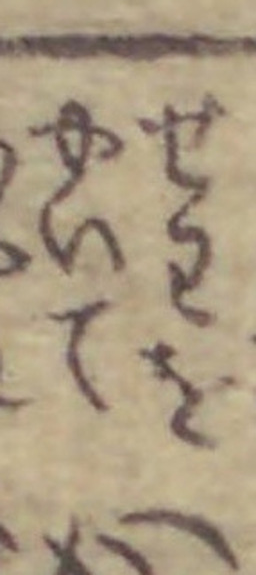やいて
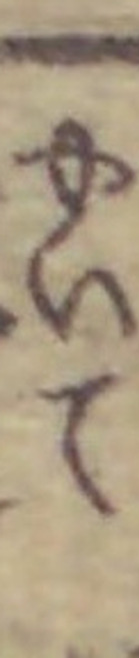やいて
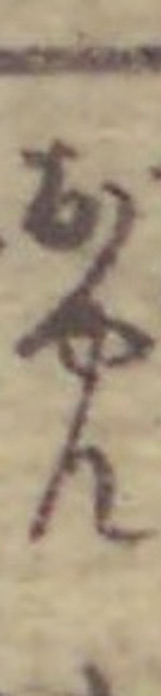おやん
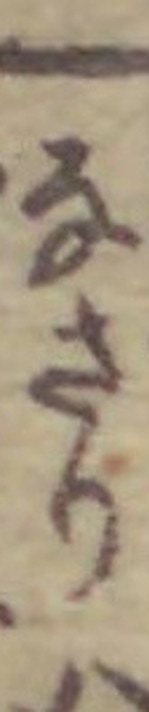なさり
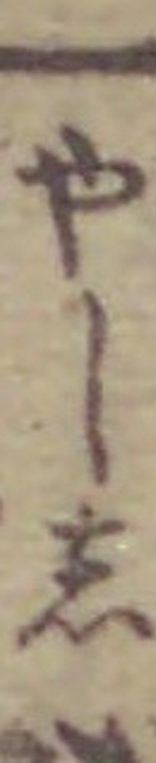やしし
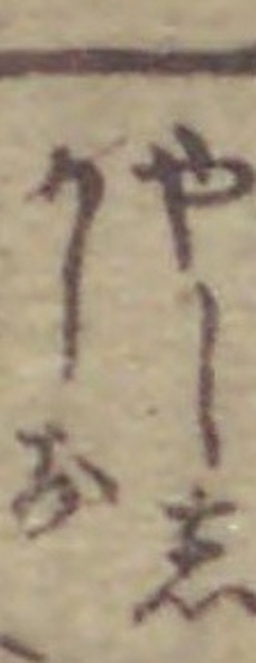かしお
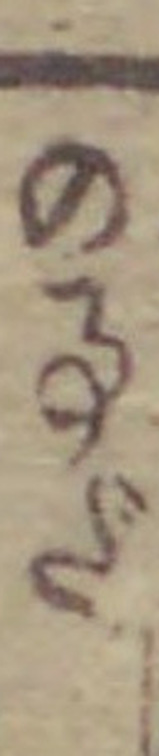の事だ
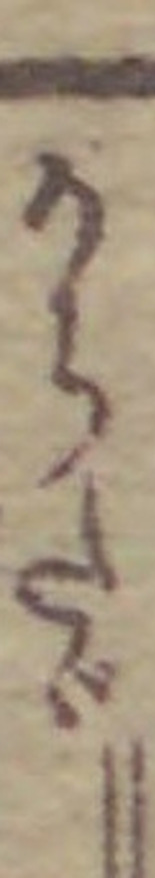からたゞ
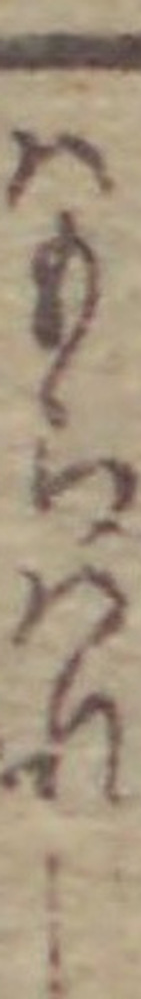はもらはれ
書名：間似合嘘言曽我 3巻
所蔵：国立国会図書館 National Diet Library, JAPAN
